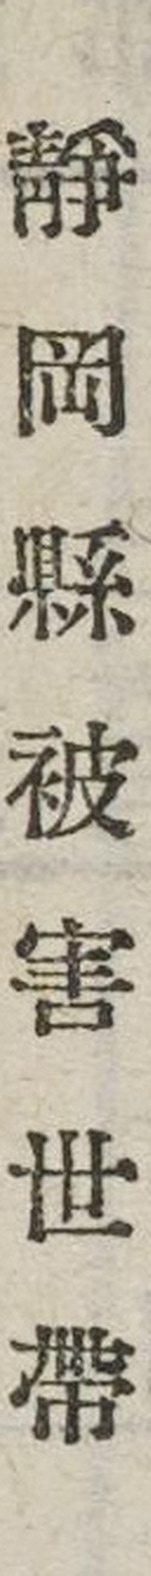静岡県被害世帯
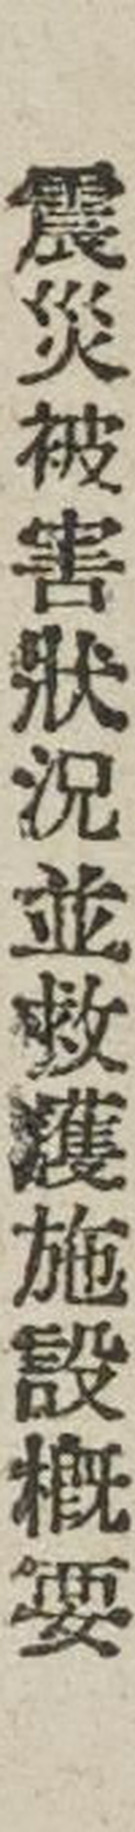震災被害状況並救護施設概要

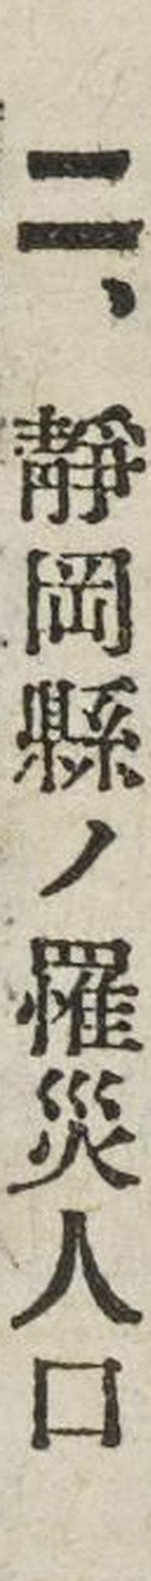ニ、静岡県ノ罹災人口
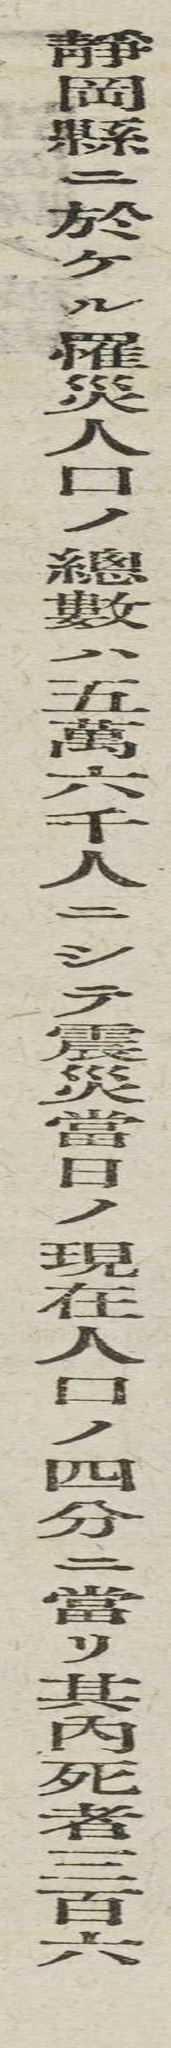静岡県ニ於ケル罹災人口ノ総数ハ五万六千人ニシテ震災当日ノ現在人口ノ四分ニ当リ其内死者三百六
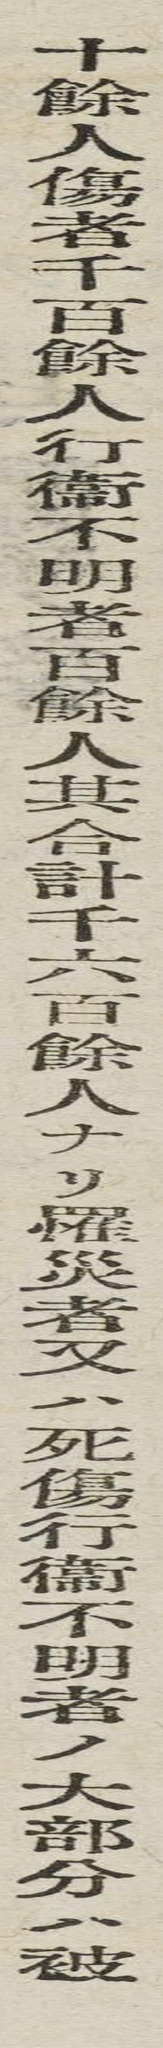十余人傷者千百余人行方不明者百余人其合計千六百余人ナリ罹災者又ハ死傷行方不明者ノ大部分ハ被
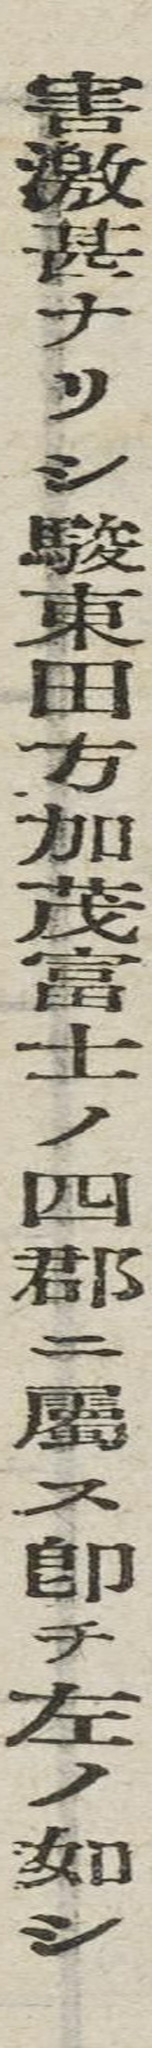害激甚ナリシ駿東田方加茂富士ノ四郡ニ属ス即チ左ノ如シ
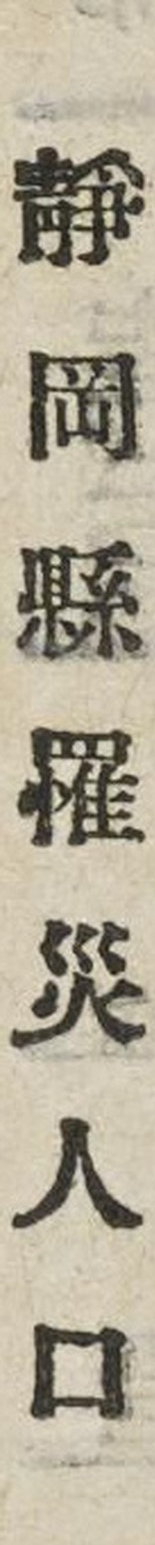静岡県罹災人口
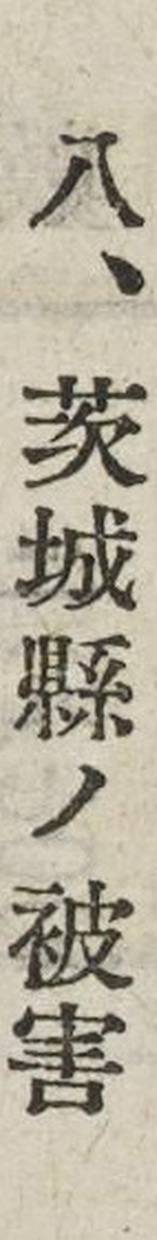八、茨城県ノ被害
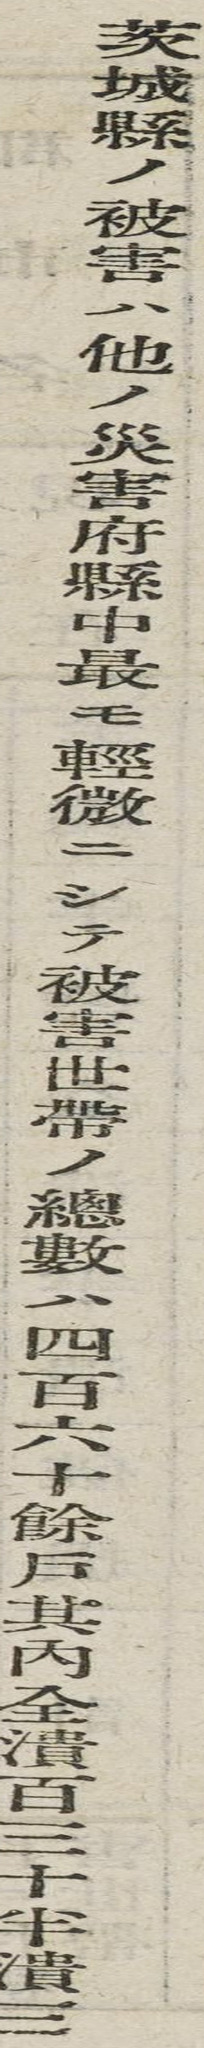茨城県ノ被害ハ他ノ災害府県中最モ軽微ニシテ被害世帯ノ総数ハ四百六十余戸其内全潰百三十半潰三
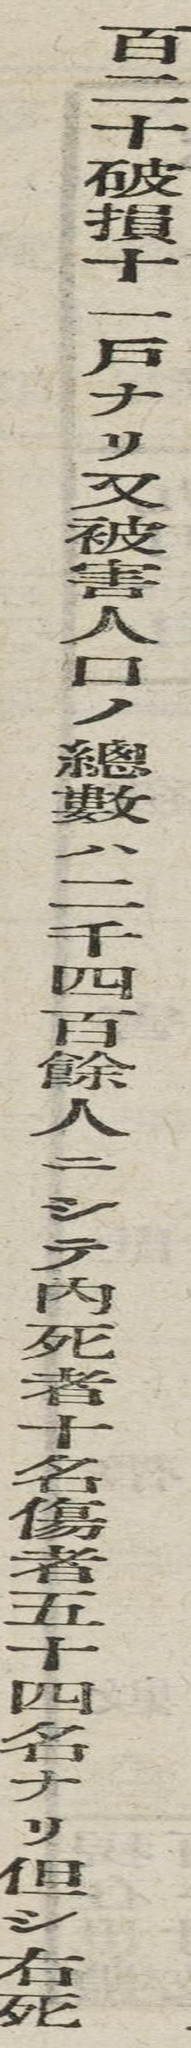百二十破損十一戸ナリ又被害人口ノ総数ハ二千四百余人ニシテ内死者十名傷者五十四名ナリ但シ右死
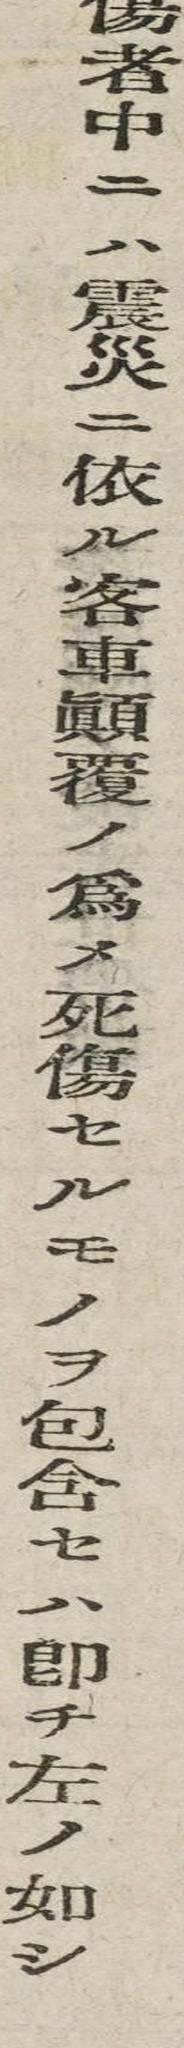傷者中ニハ震災ニ依ル客車転覆ノ為メ死傷セルモノヲ包含セハ即チ左ノ如シ

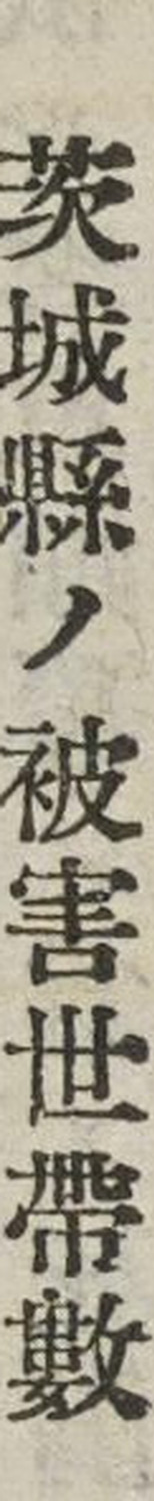茨城県ノ被害世帯数
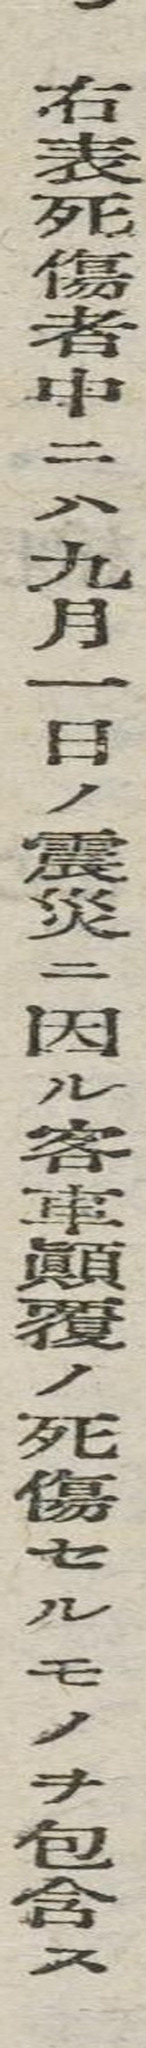備考右表死傷者中ニハ九月一日ノ震災ニ因ル客車転覆ノ死傷セルモノヲ包含ス
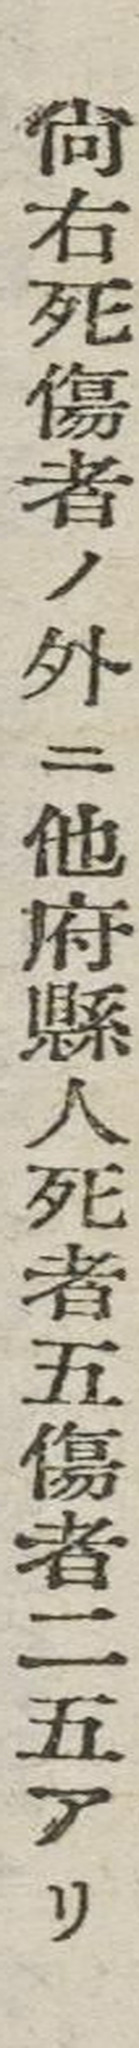尚右死傷者ノ外ニ他府県人死者五傷者二五アリ
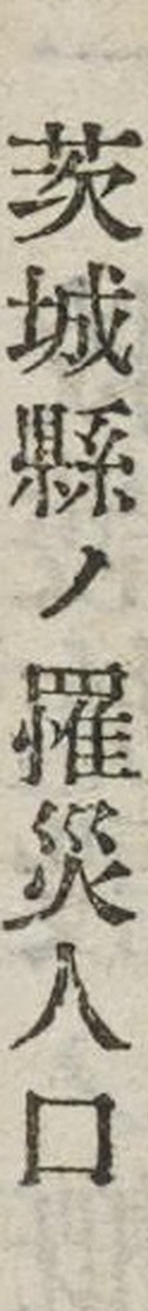茨城県ノ罹災人口

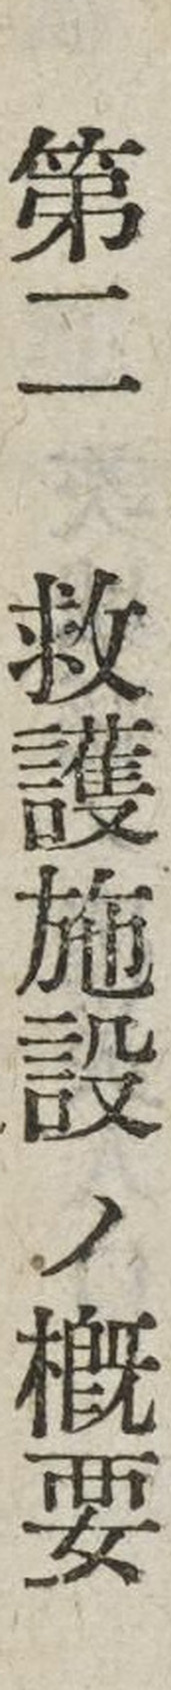第二救護施設ノ概要
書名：震災被害状況並救護施設概要
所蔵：東京大学地震研究所図書室 Earthquake Research Institute Library, The University of Tokyo, JAPAN
